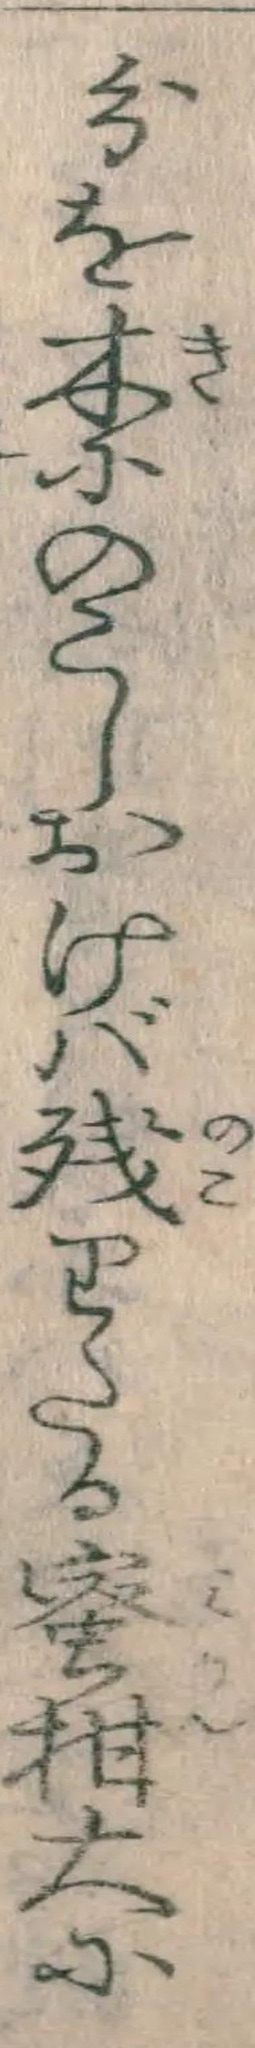分を木にのこしおけば残りたる蜜柑大に
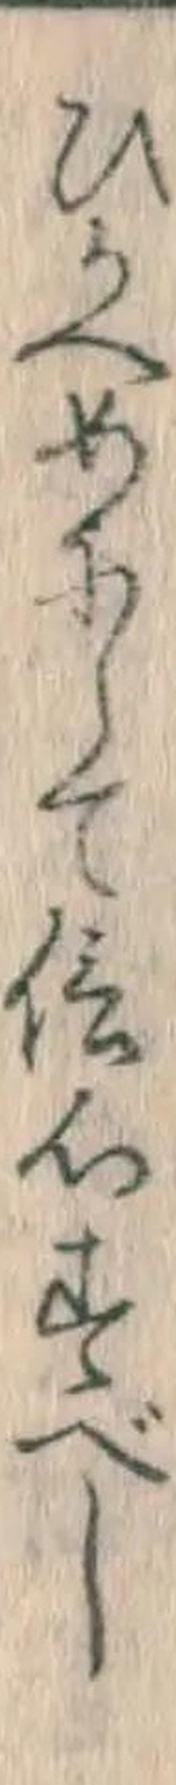ひかへめにして信心すべし
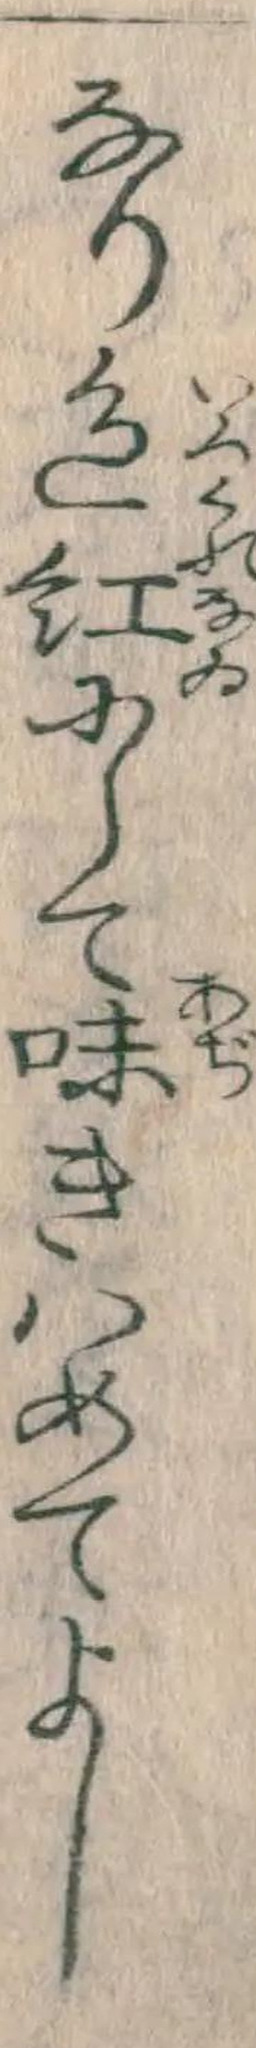なり色紅にして味きはめてよし
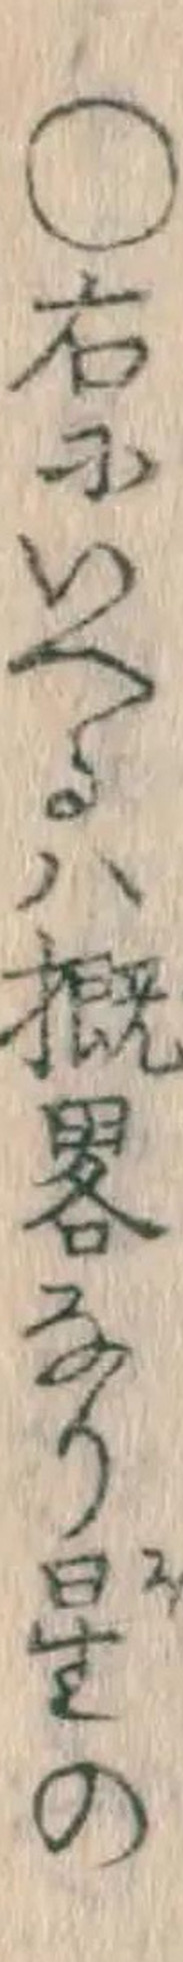○右にいへるは概略なり星の
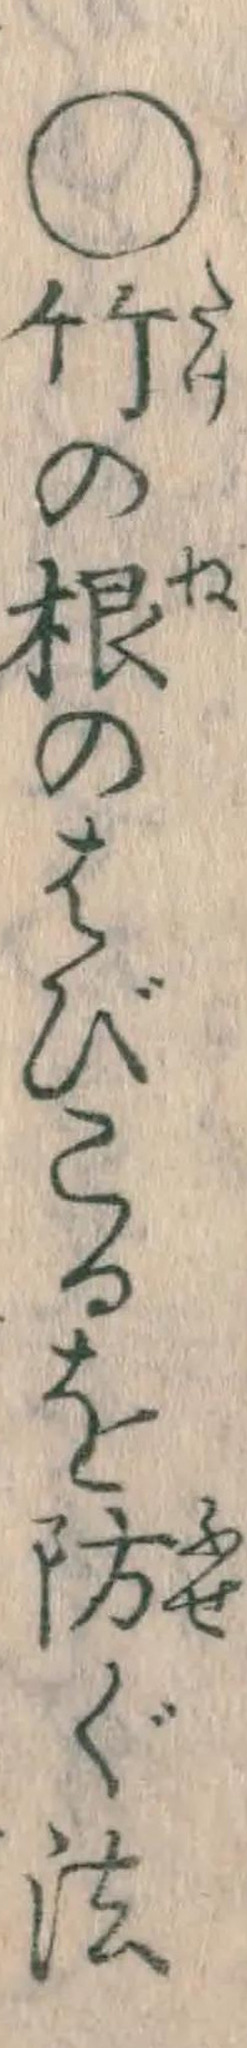○竹の根のはびこるを防ぐ法
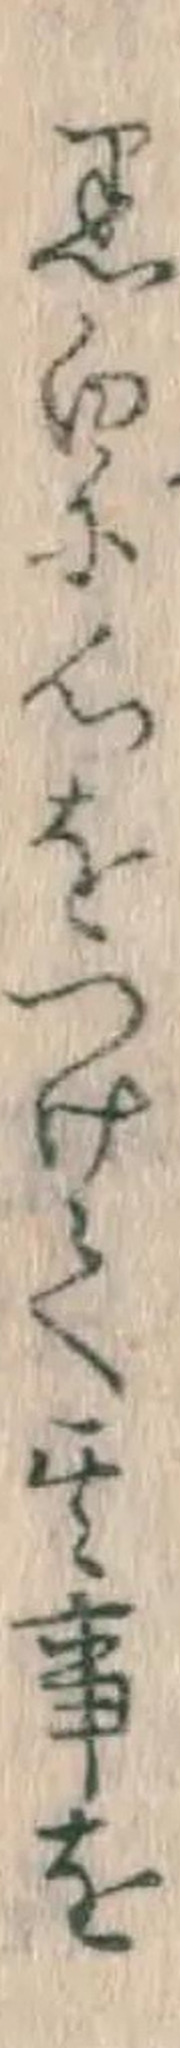黒白に心をつけて其事を
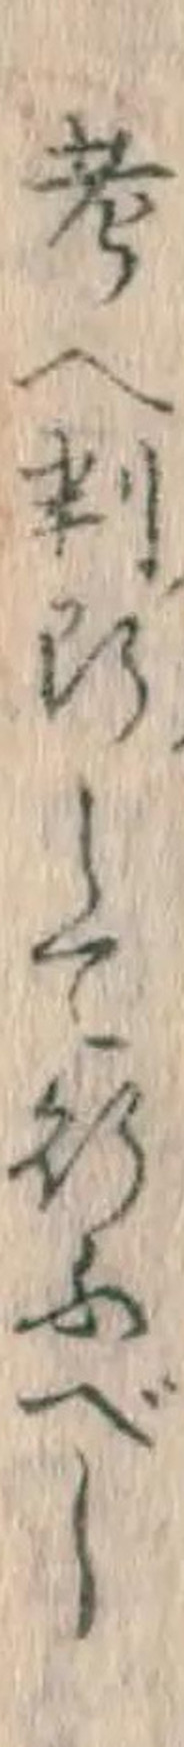考へ判断して行ふべし
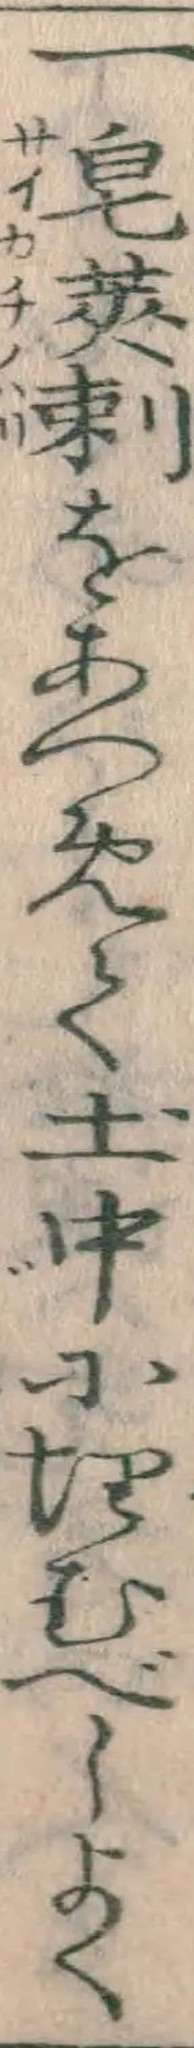一皁莢刺をあつめて土中に埋むべしよく
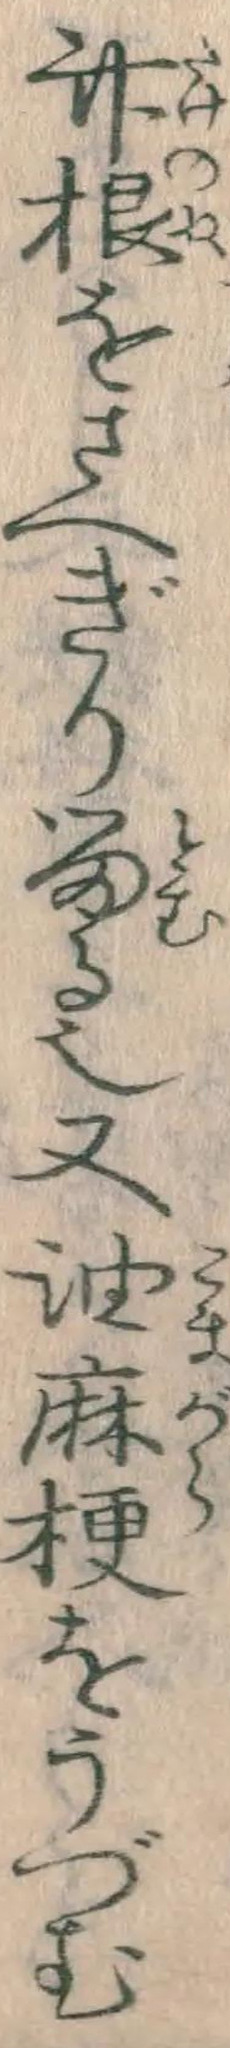竹根をさへぎり留る也又油麻梗をうづむ
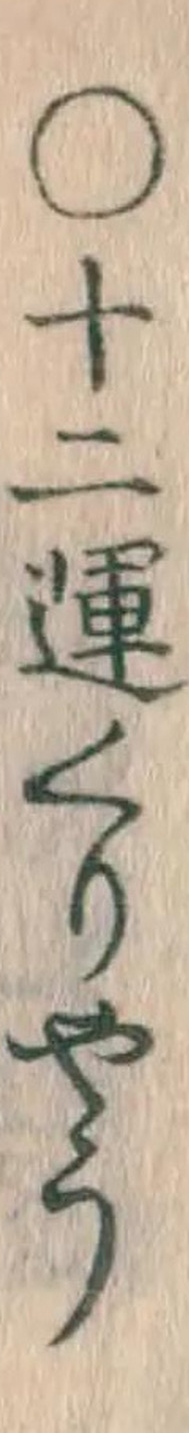○十二運くりやう
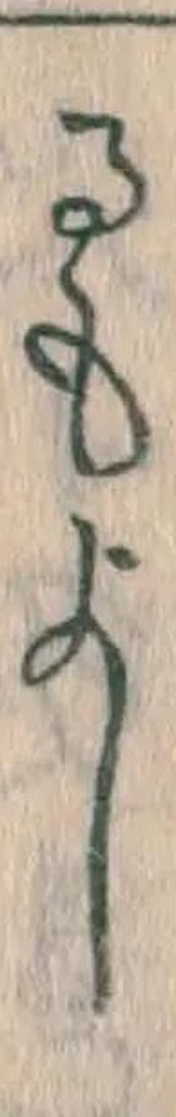るもよし
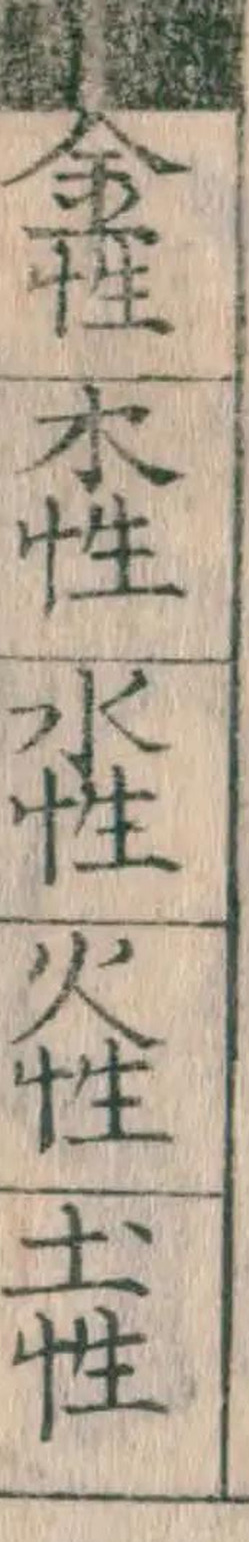金性木性水性火性土性
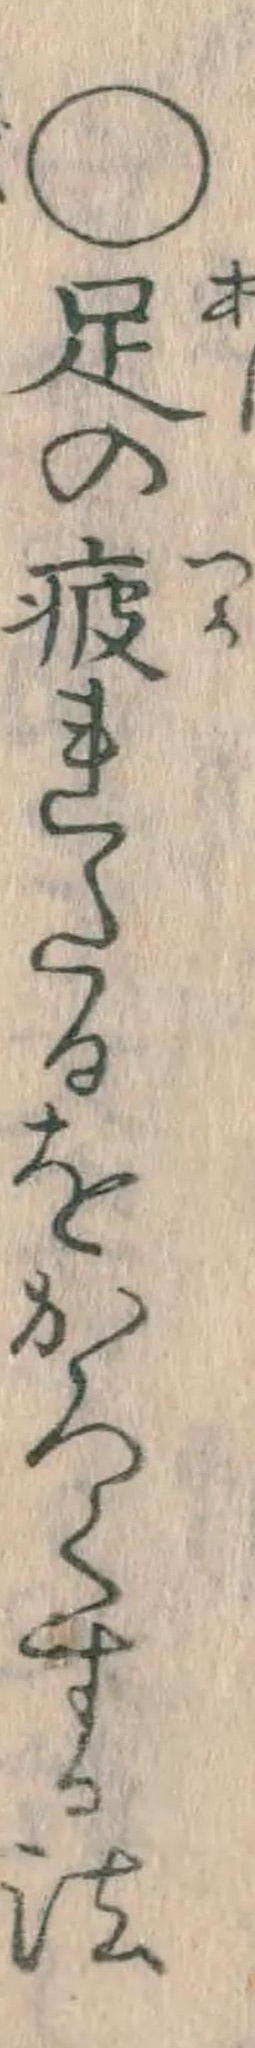○足の疲れたるをかろくする法
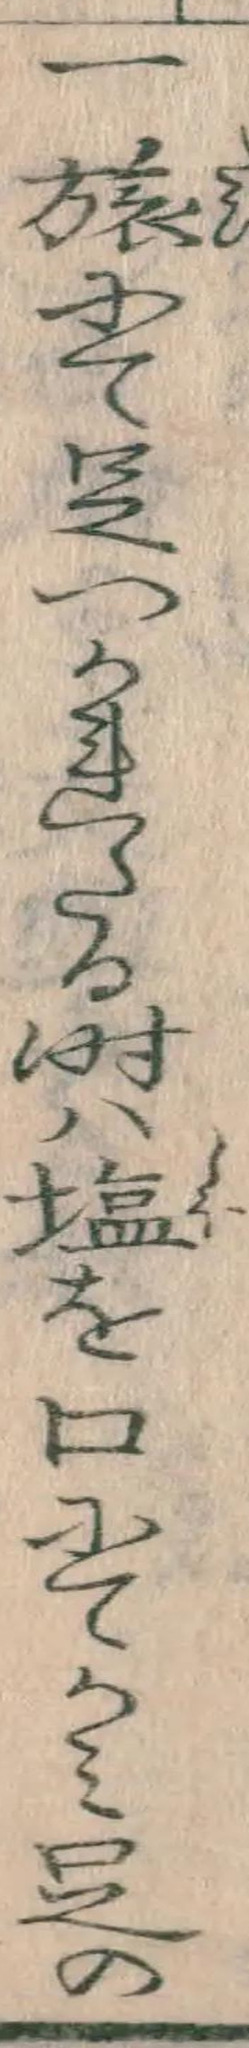一旅にて足つかれたる時は塩を口にてかみ足の
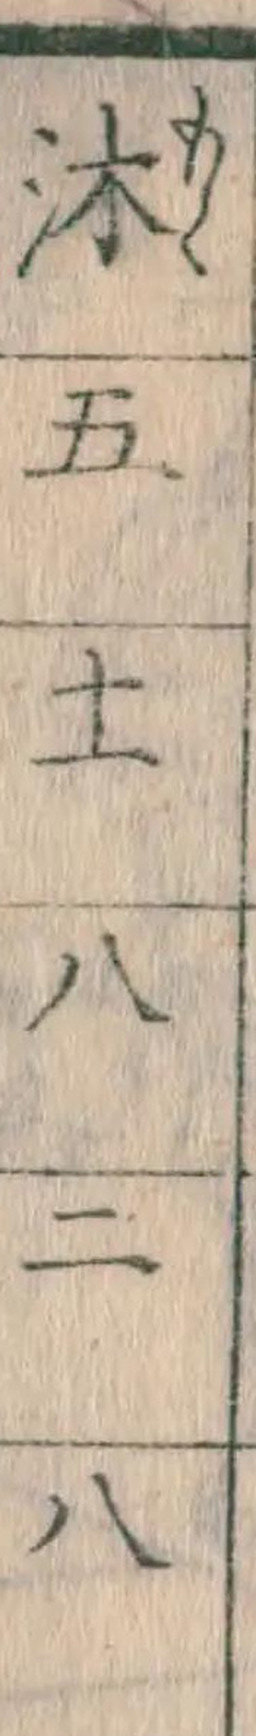沐五十一八二八
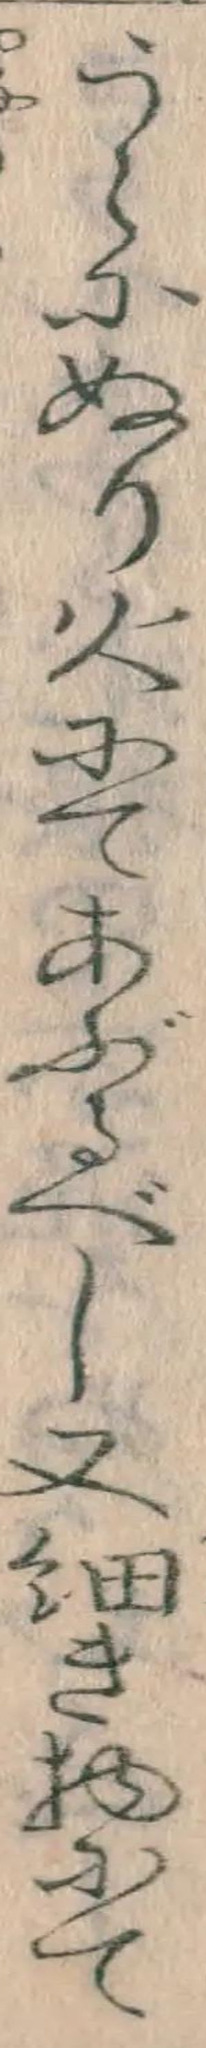うらにぬり火にてあぶるべし又細き物にて
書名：広益秘事大全 3巻. [2]
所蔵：国立国会図書館 National Diet Library, JAPAN
